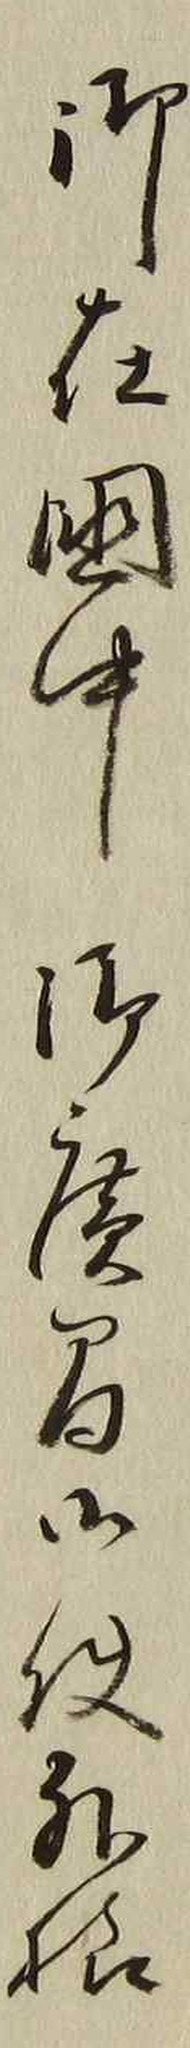御在国中御広間御使外様
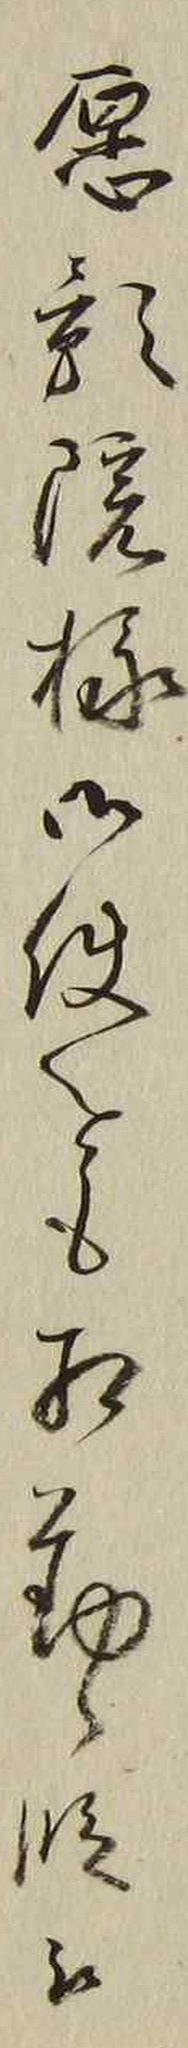愿彰院様御使をも相勤候段被
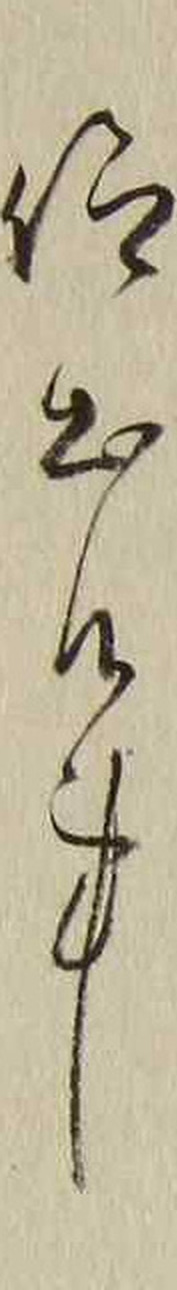仰出候事
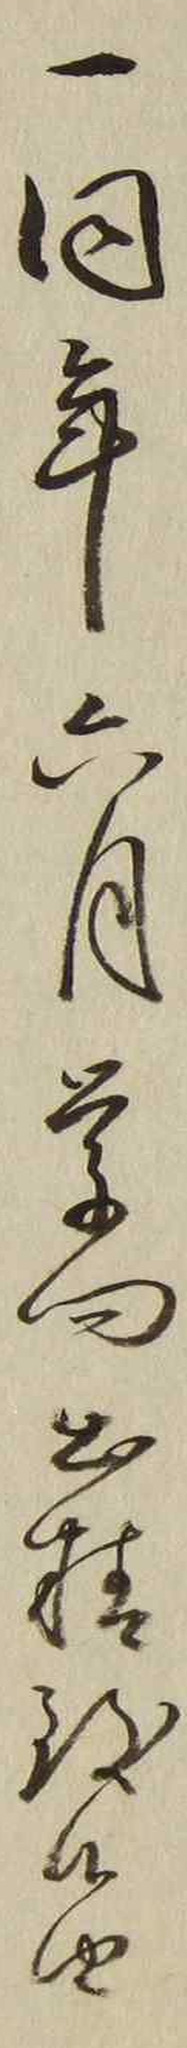一同年六月学問出精致候由

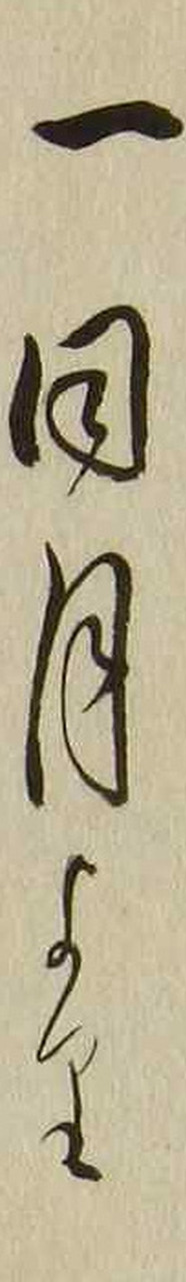一同月より
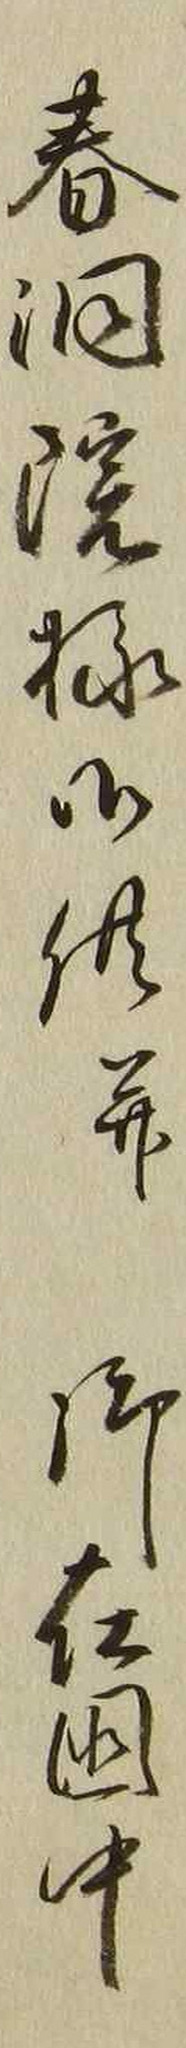春洞院様御供幷御在国中
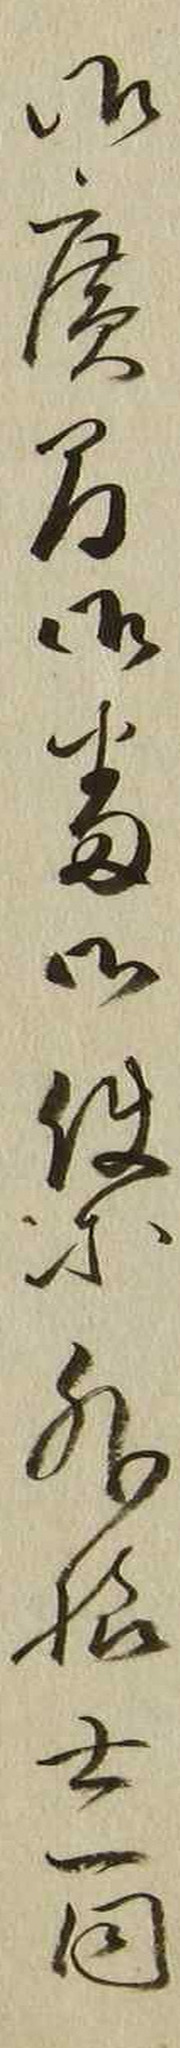御広間御番御使等外様士一同
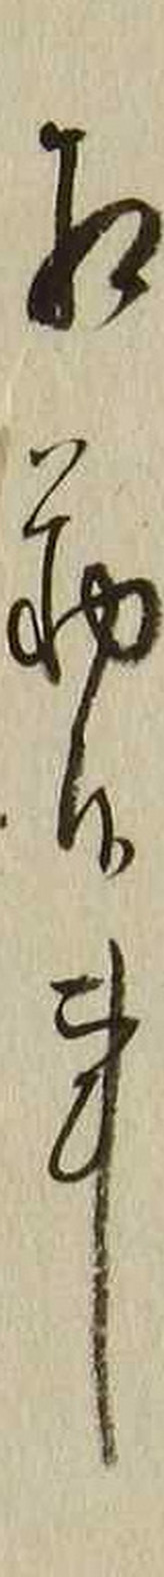相勤候事
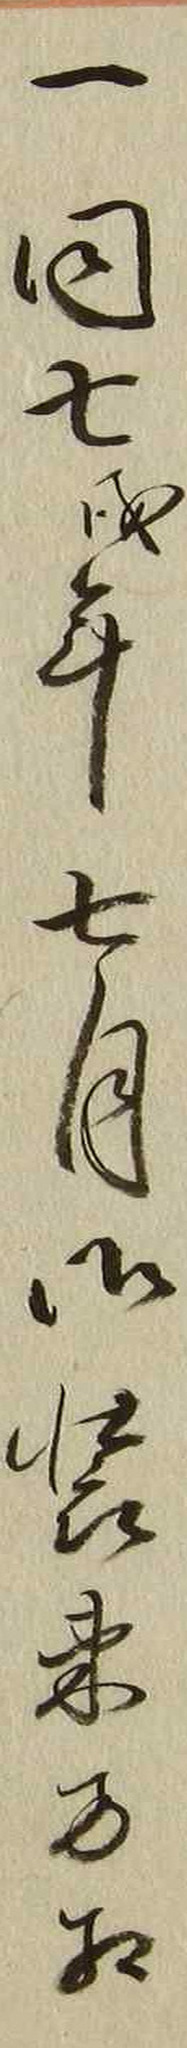一同七戌年七月御装束方相
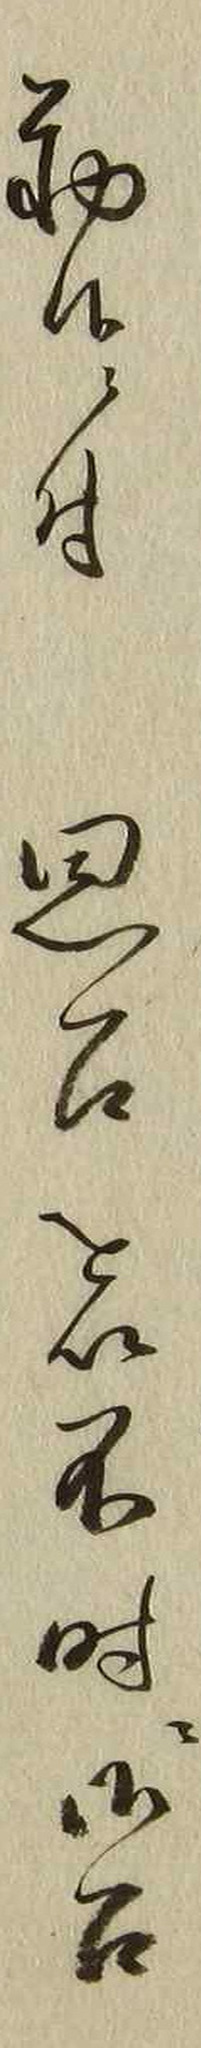勤候ニ付思召を以不時ニ御召
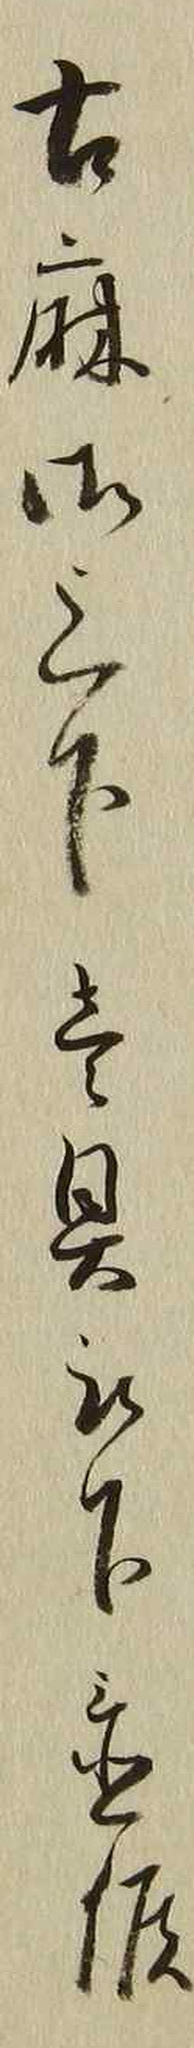古麻御上下壱具被下置候
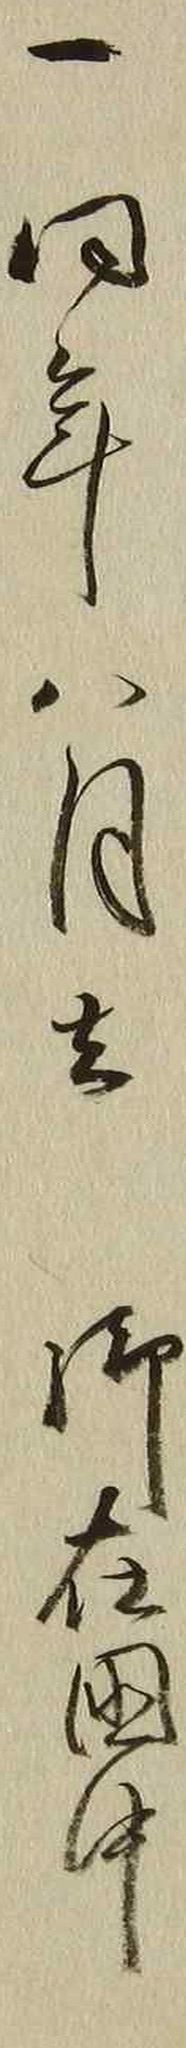一同年八月去御在国中
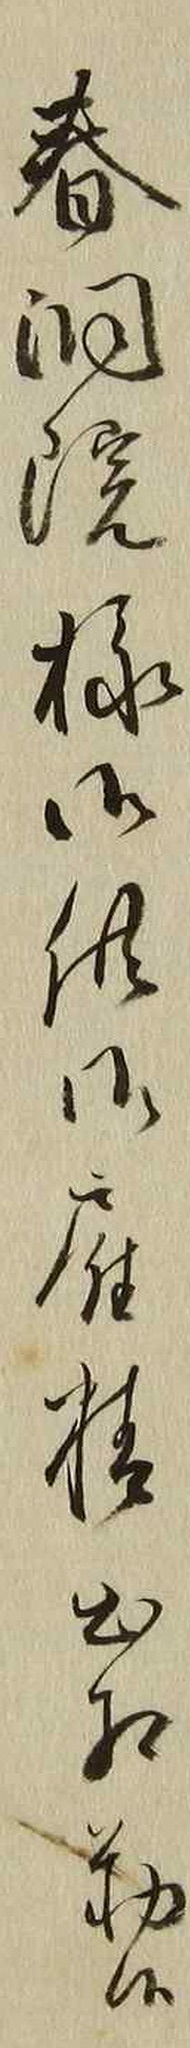春洞院様御供御雇精出相勤候
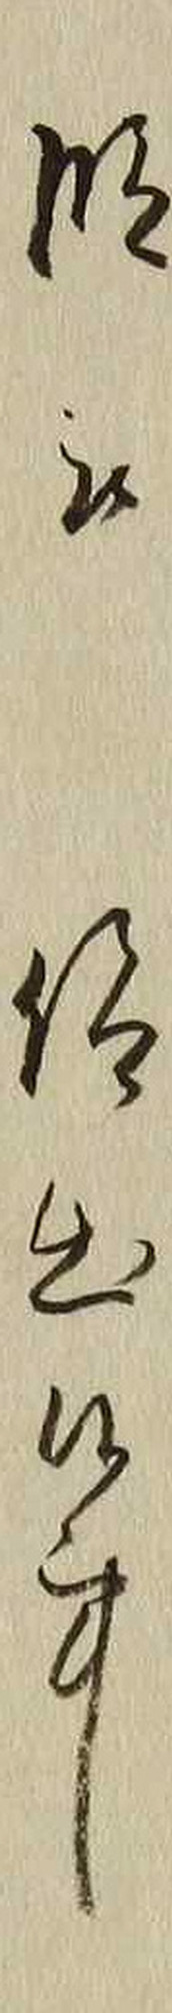段被仰出候事
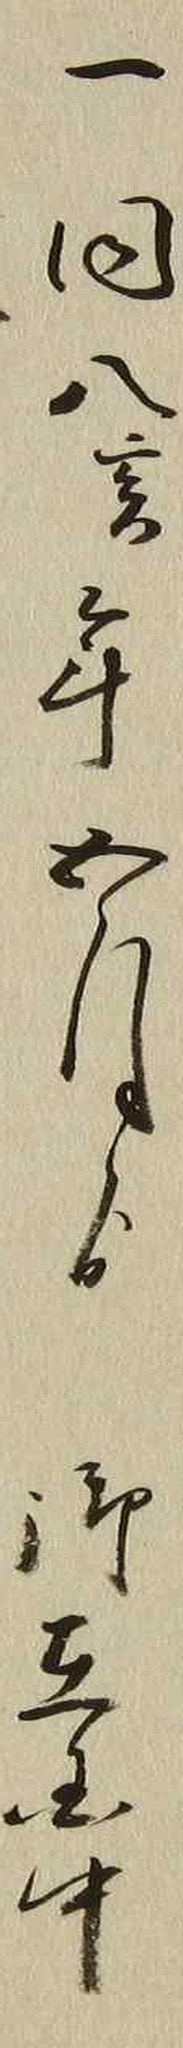一同八亥年五月ゟ御在国中
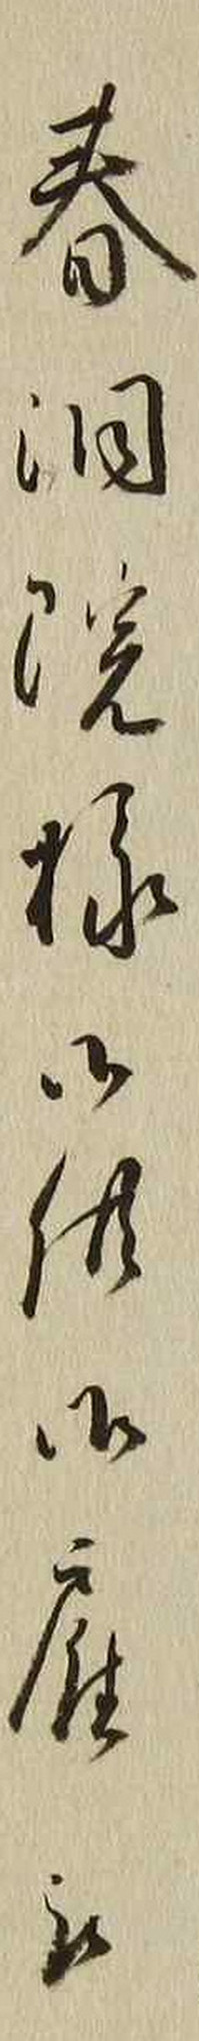春洞院様御供御雇被
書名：諸士系譜　巻之70　を之部4
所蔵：会津若松市立会津図書館
